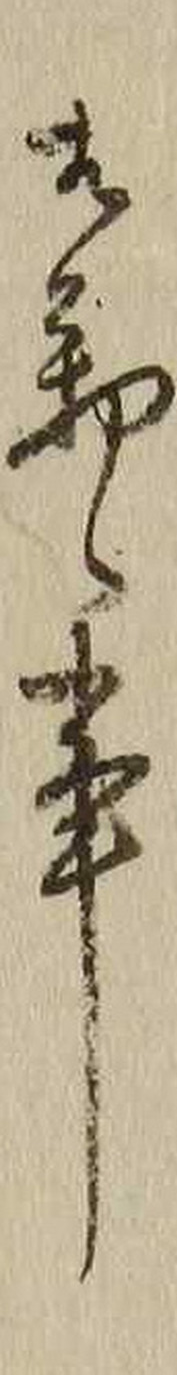相勤候事
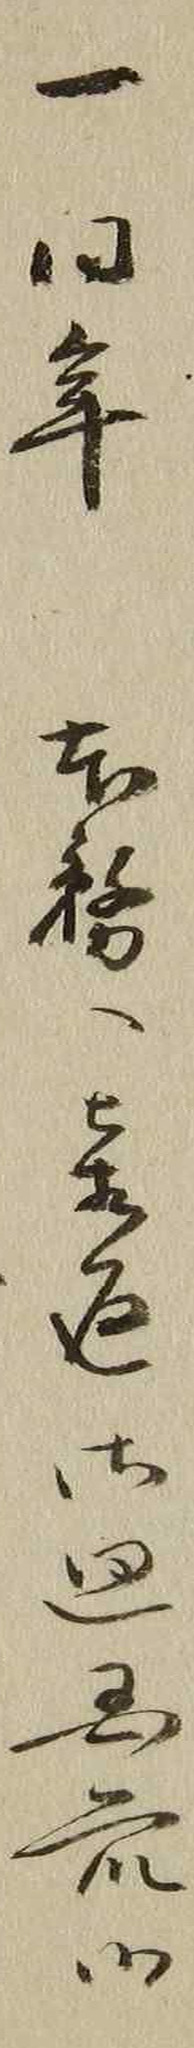一同年本務へ被相返御廻国衆御
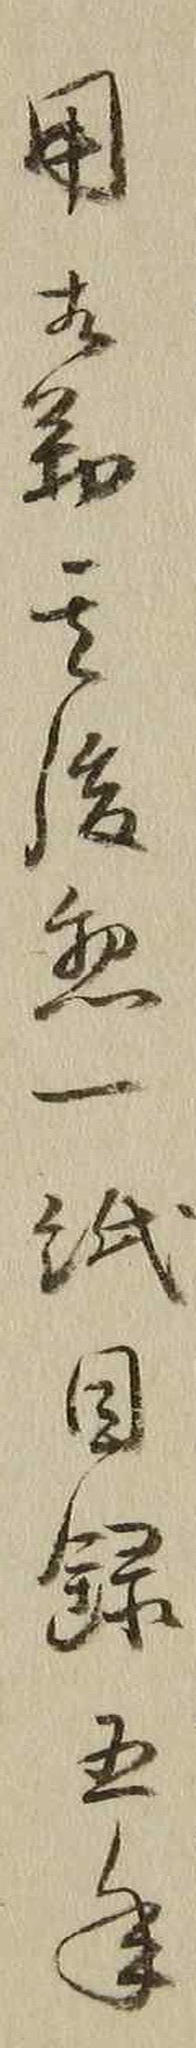用相勤其後惣一紙目録五年
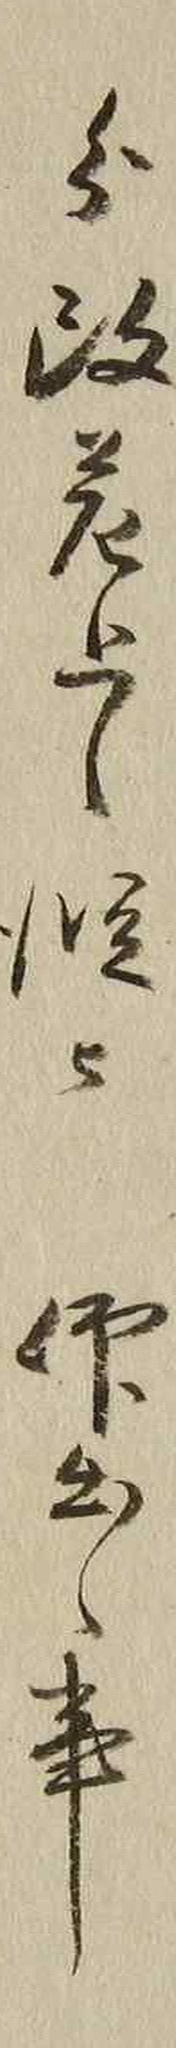分改差上候段被仰出候事
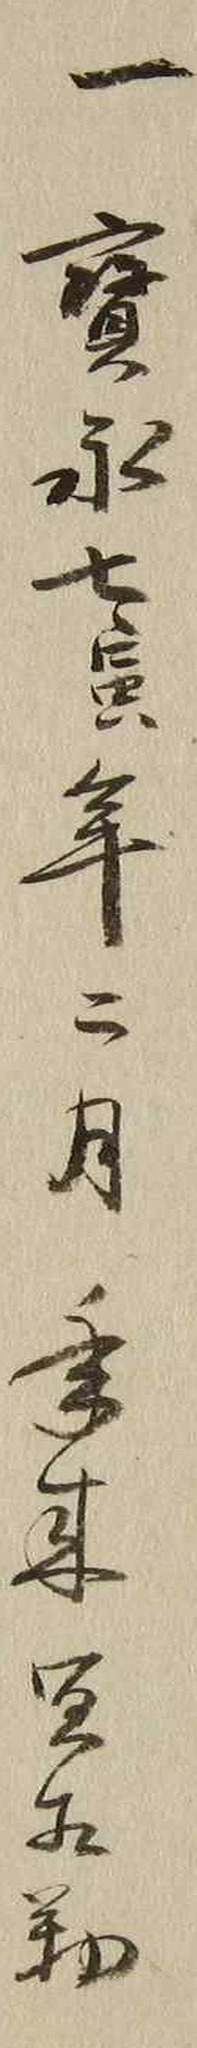一宝永七寅年二月年来宜相勤
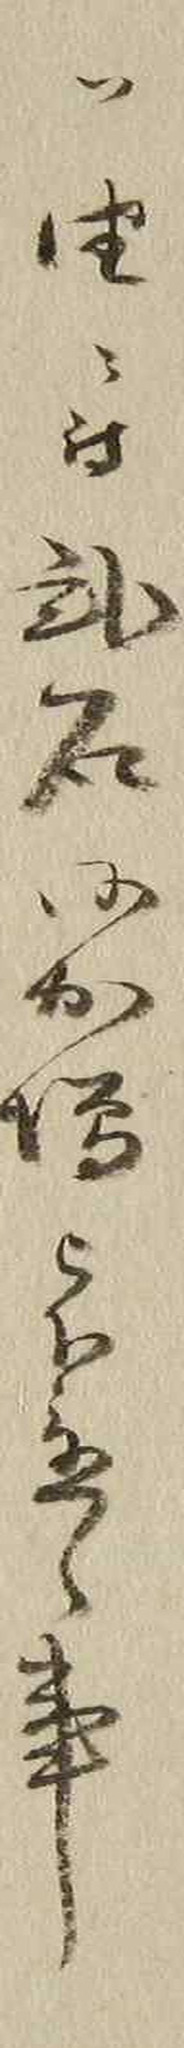候由ニ付弐石御加増被下置候事
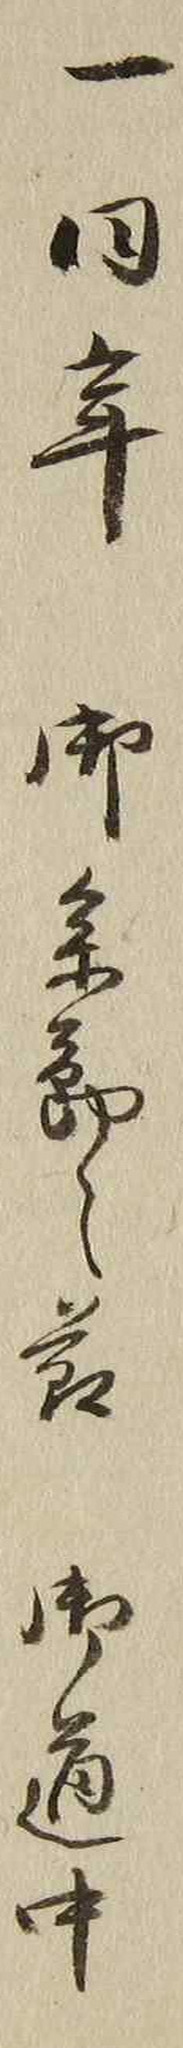一同年御参勤之節御道中
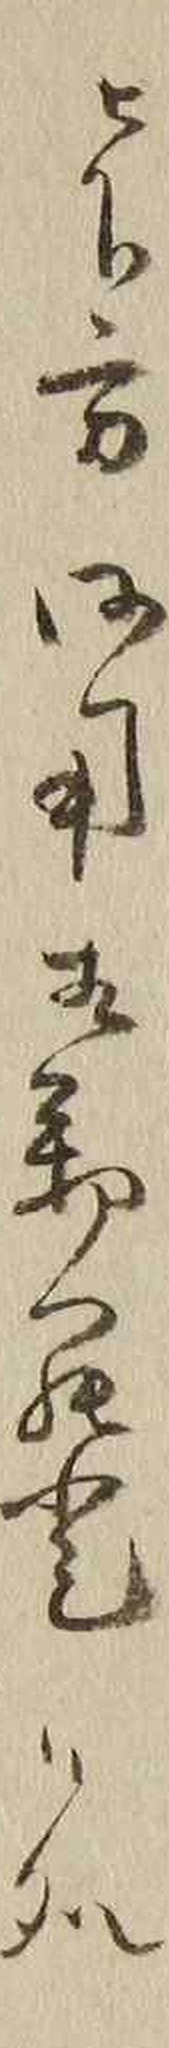被下方御用相勤罷登候処
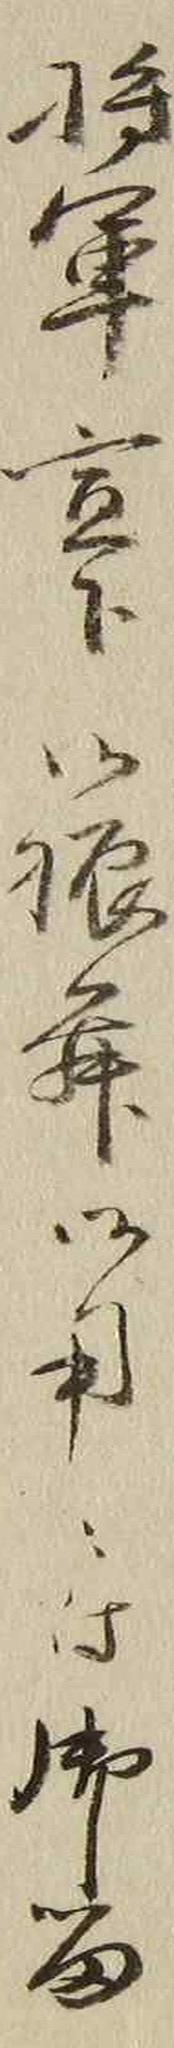将軍宣下御振舞御用ニ付御留
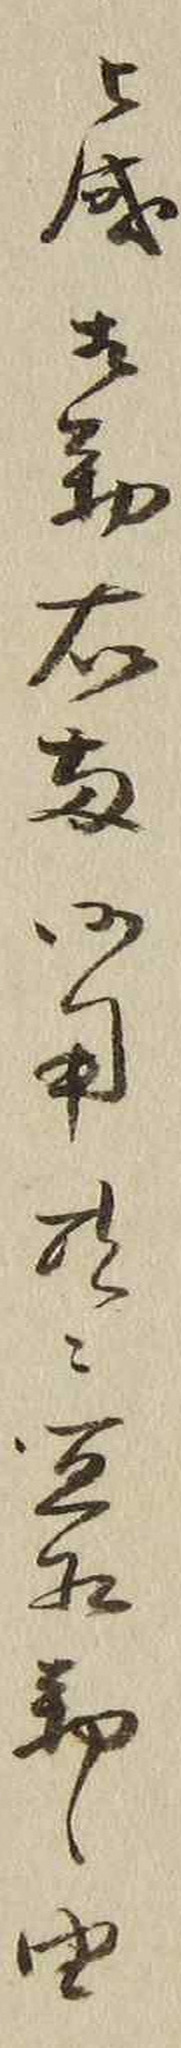被成相勤右両御用共々宜相勤候由
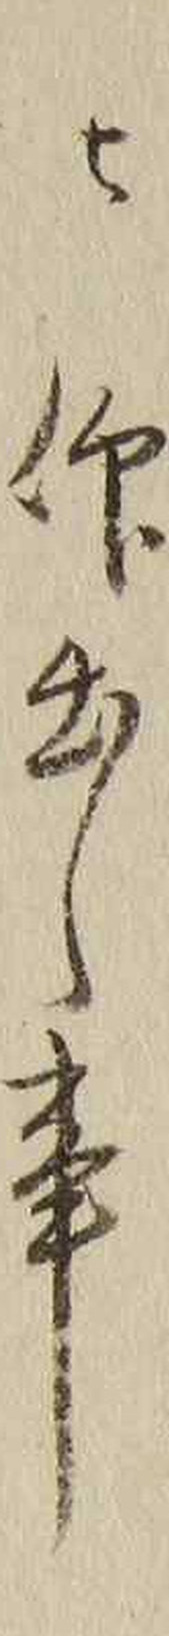被仰出候事
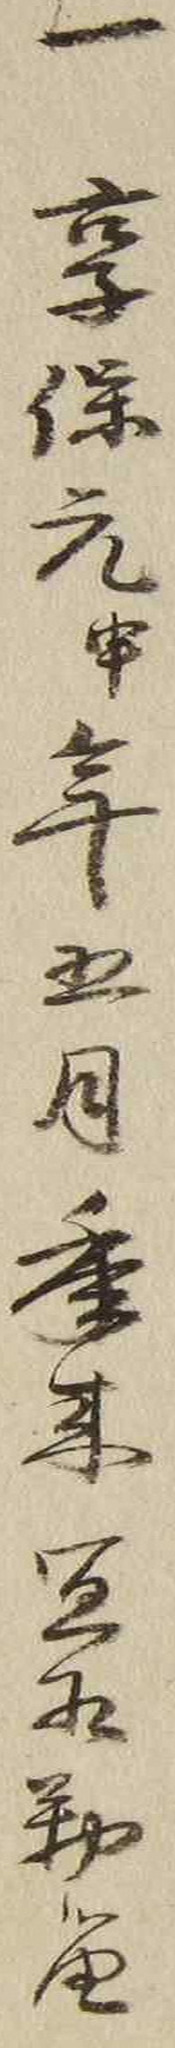一享保元申年五月年来宜相勤候由
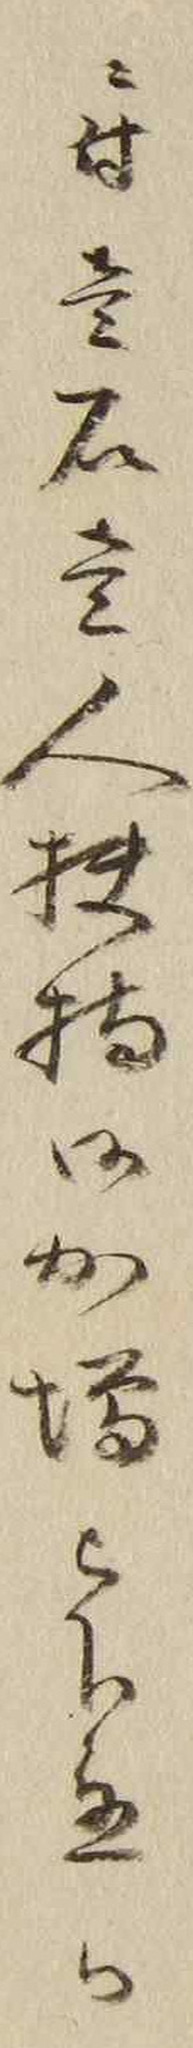ニ付壱石壱人扶持御加増被下置候

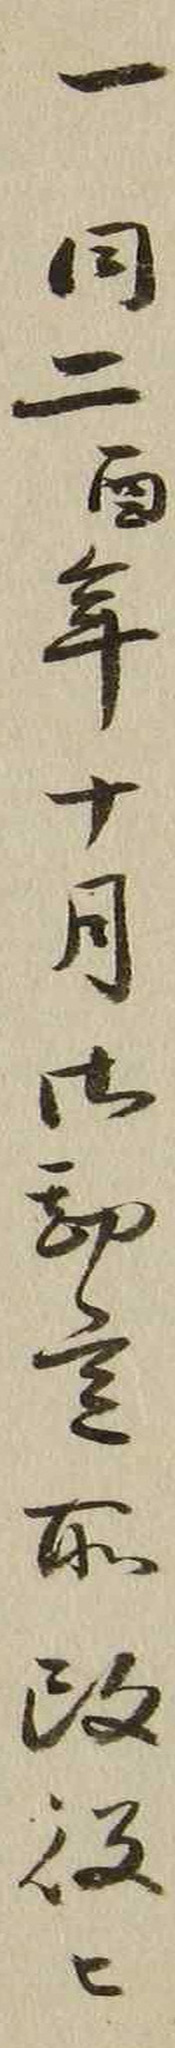一同二酉年十月御勘定所改役被
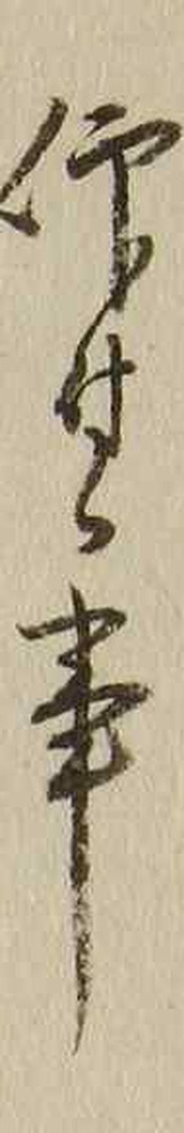仰付候事
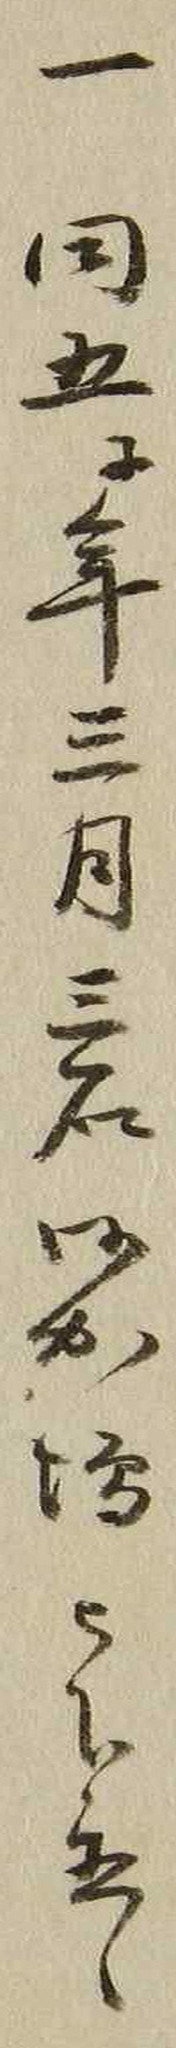一同五子年三月三石御加増被下置候
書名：諸士系譜　巻之236　ふ之部4
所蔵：会津若松市立会津図書館
